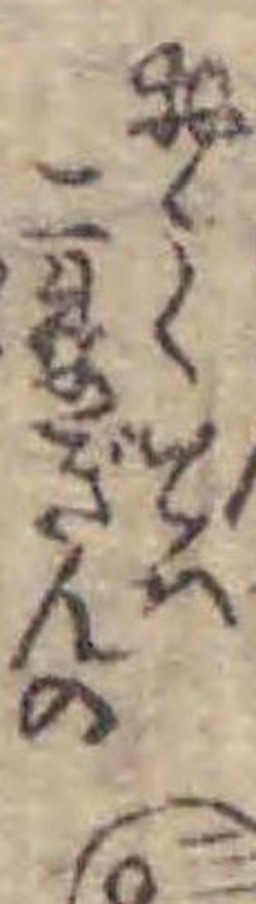二朱ぎんの
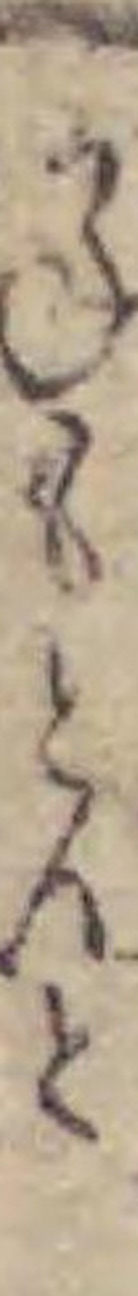かねもとんと
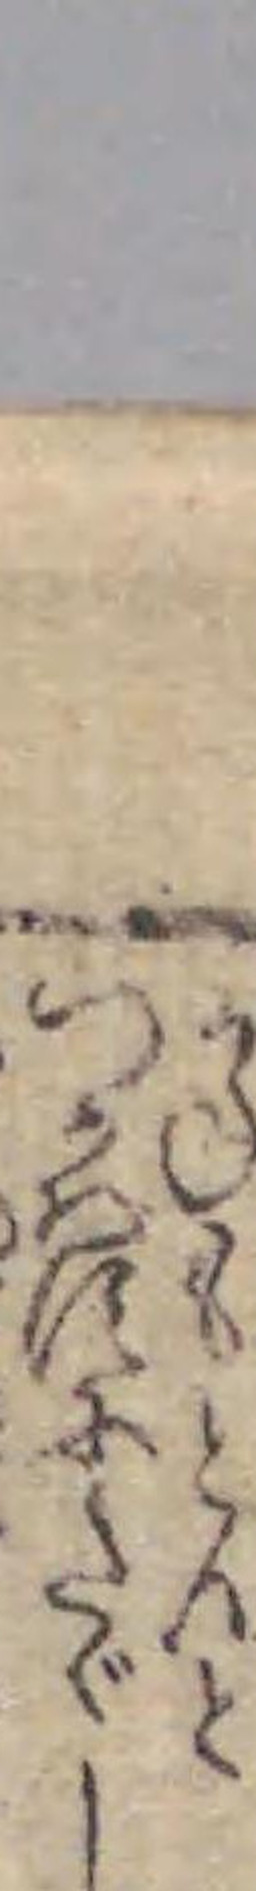つかはすにたゞ
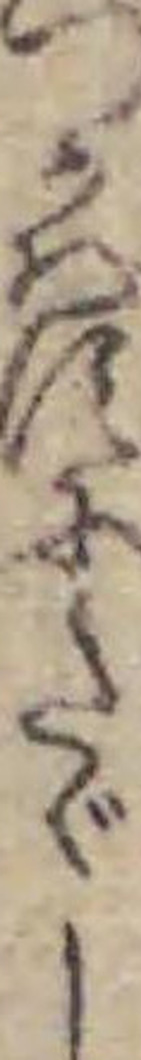つかはすにたゞ
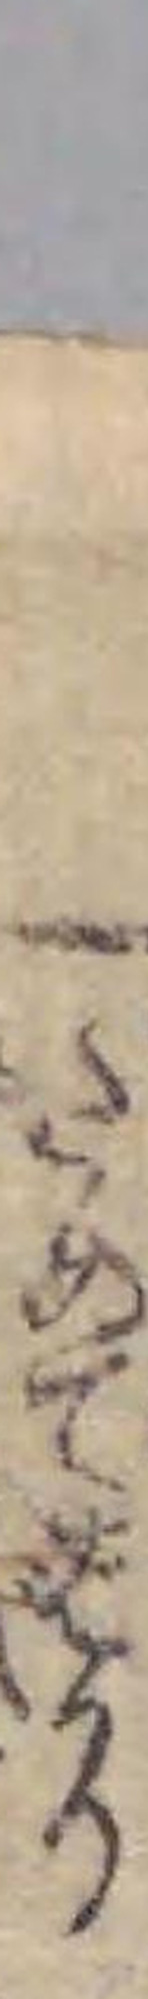ためてばかり
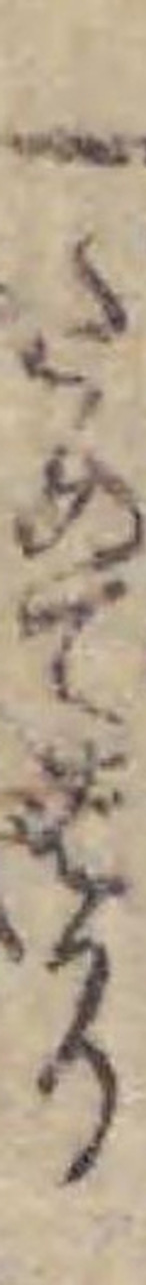ためてばかり
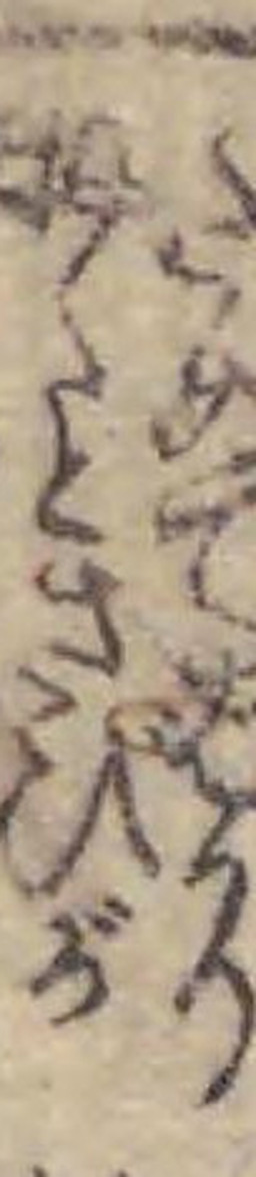おくとさびが
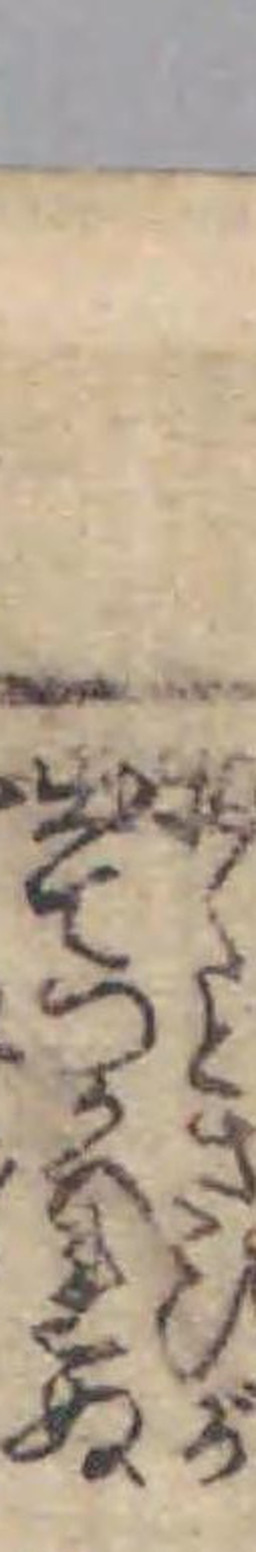出てつかはれぬ
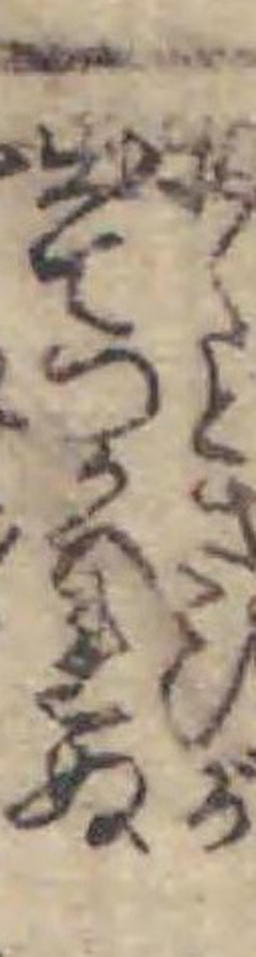出てつかはれぬ
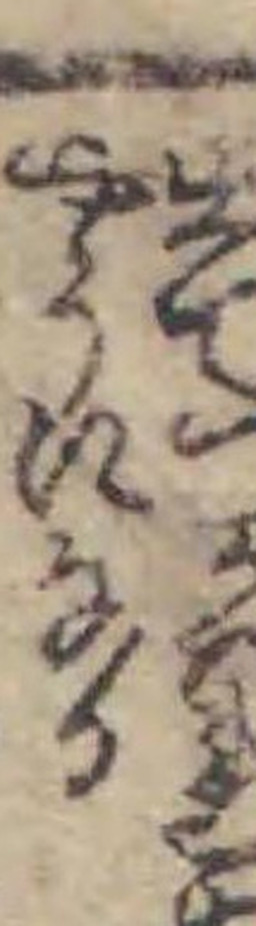やうになる
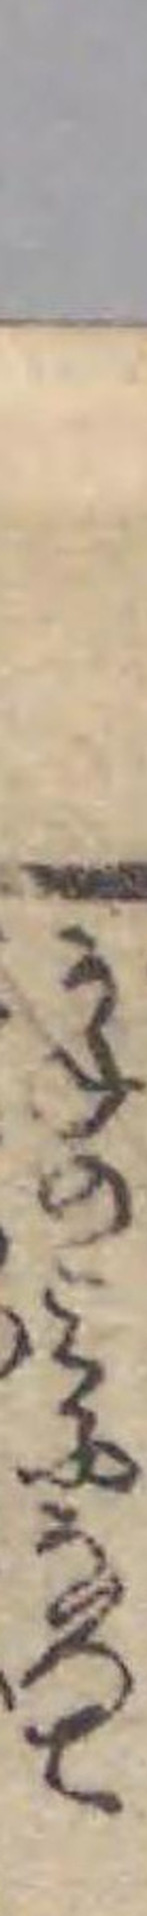かねのみになつて
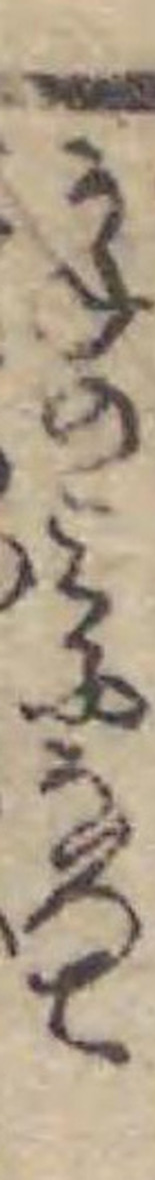かねのみになつて
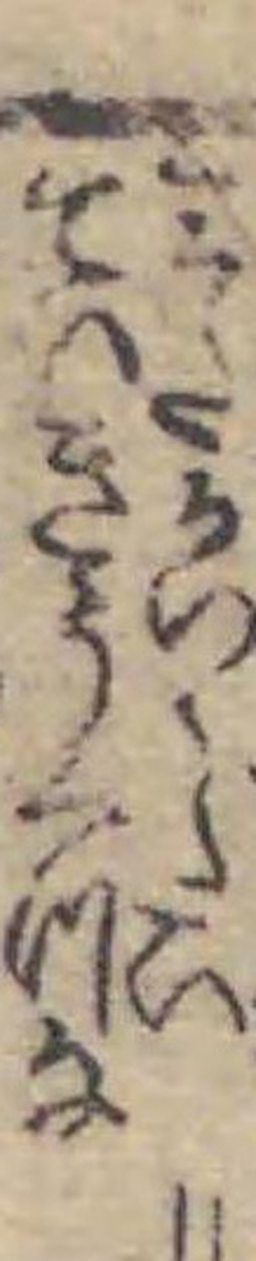ていきうくつな
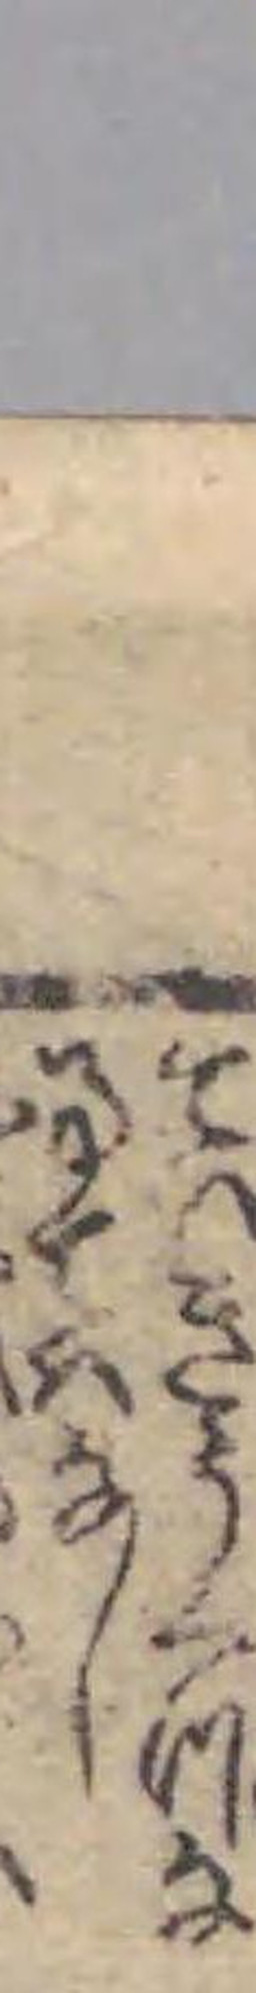事てはなし
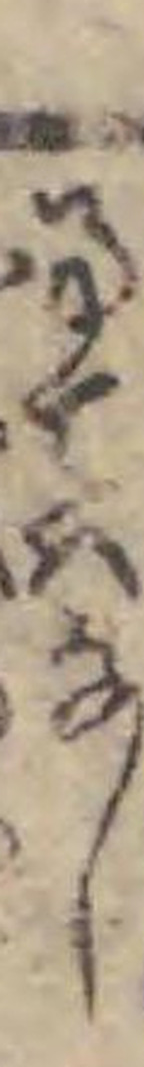事てはなし
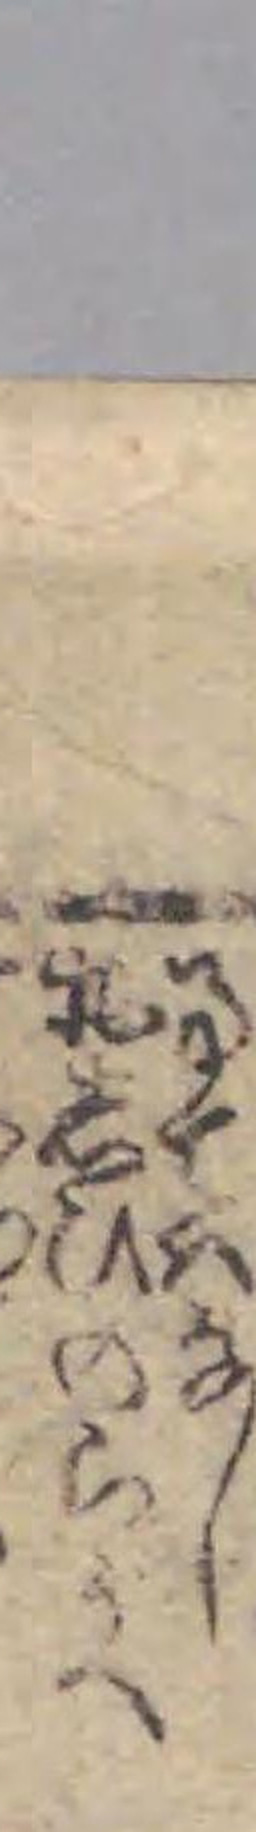おしひのらうへ
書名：新鋳小判 : 3巻
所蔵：国立国会図書館 National Diet Library, JAPAN
